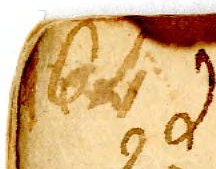64
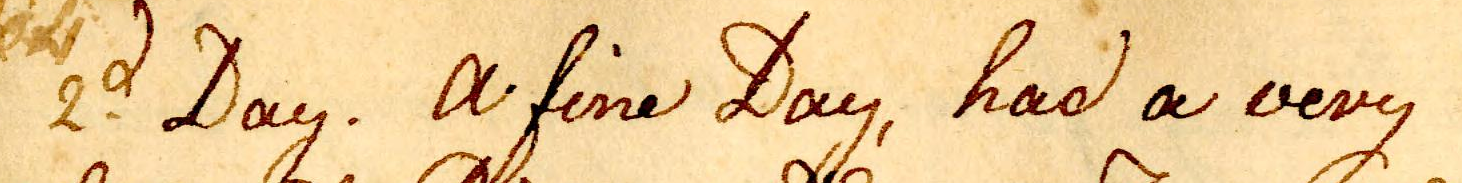2^d Day. A fine Day, had a very
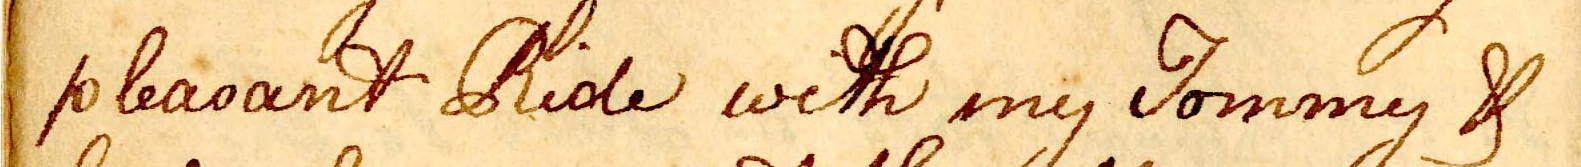pleasant Ride with my Tommy &
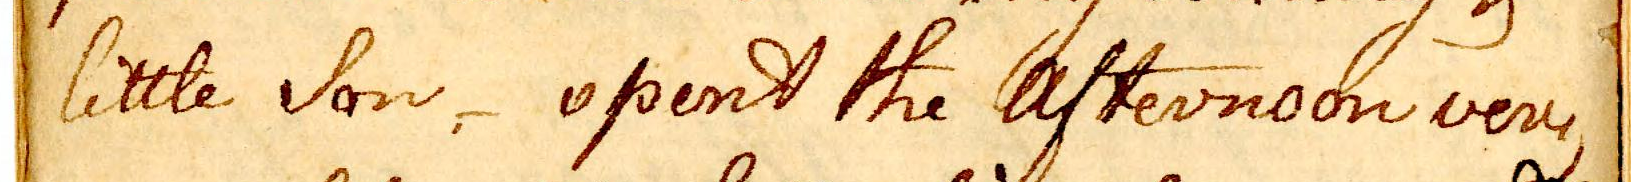little Son, spent the Afternoon very
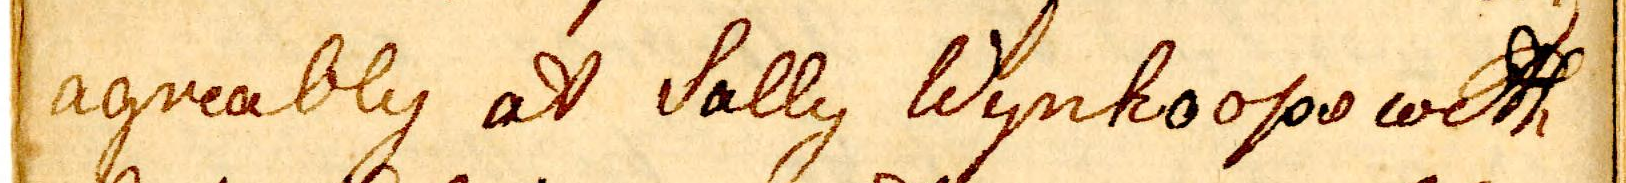agreably at Sally Wynkoops with
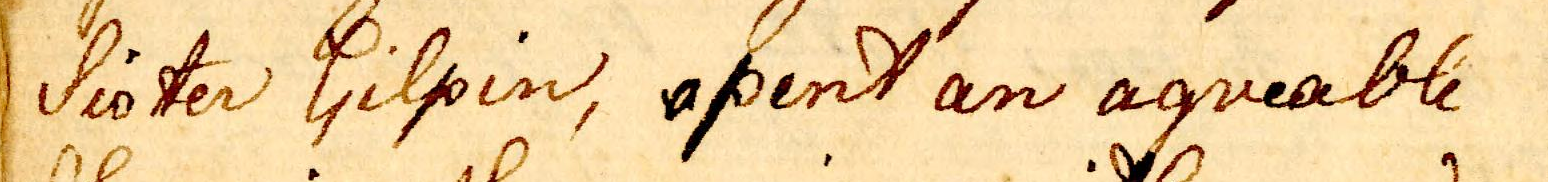Sister Gilpin, spent an agreable
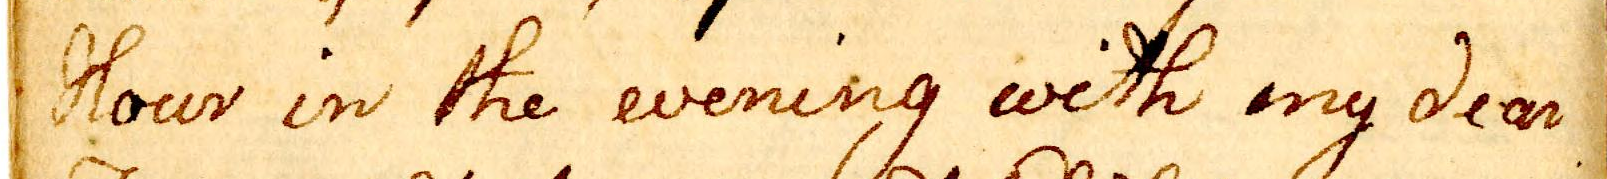Hour in the evening with my dear
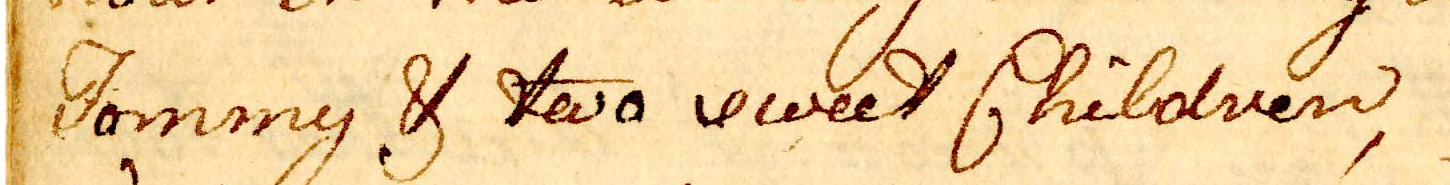Tommy & two sweet Children,
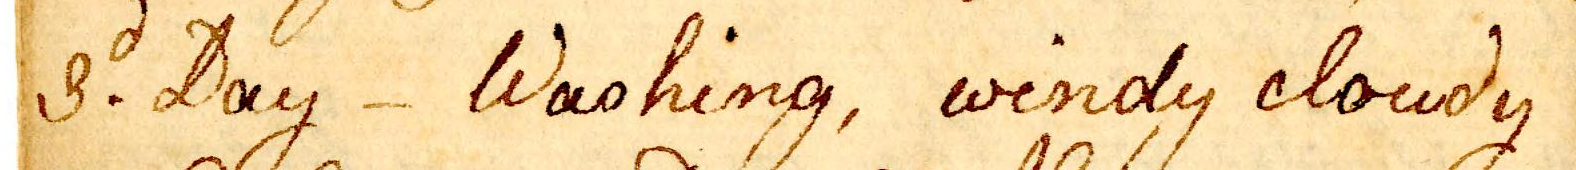3^d. Day- Washing, windy cloudy
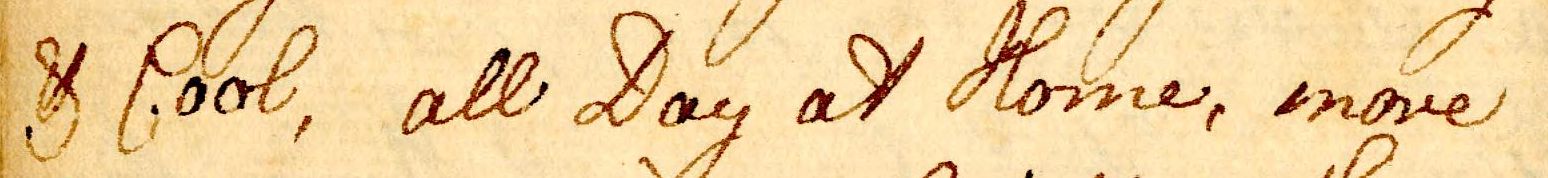& Cool, all Day at Home, more
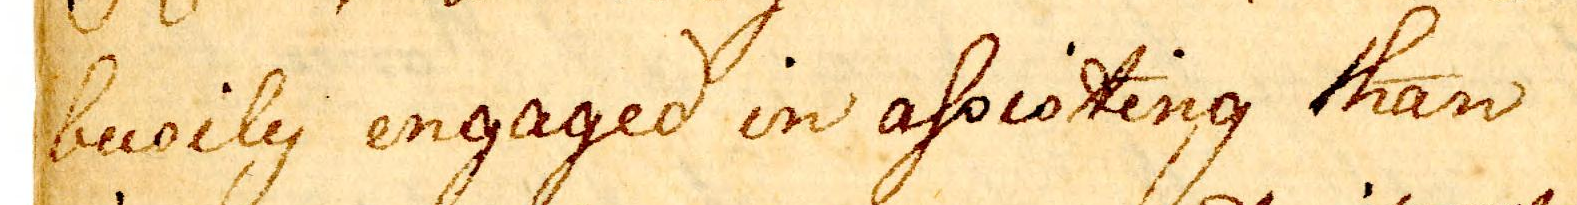busily engaged in assisting than
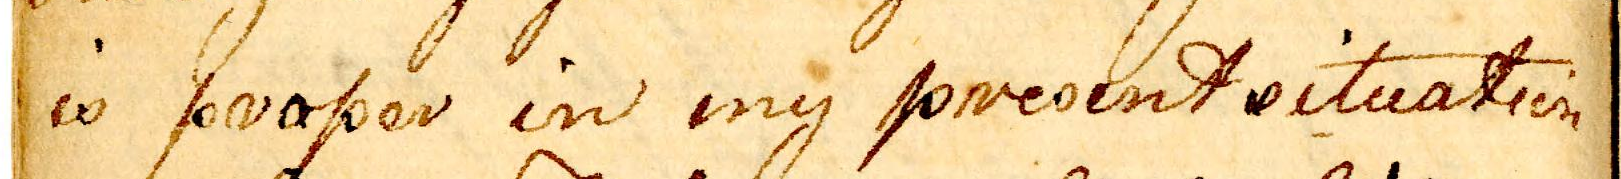is proper in my present situation
